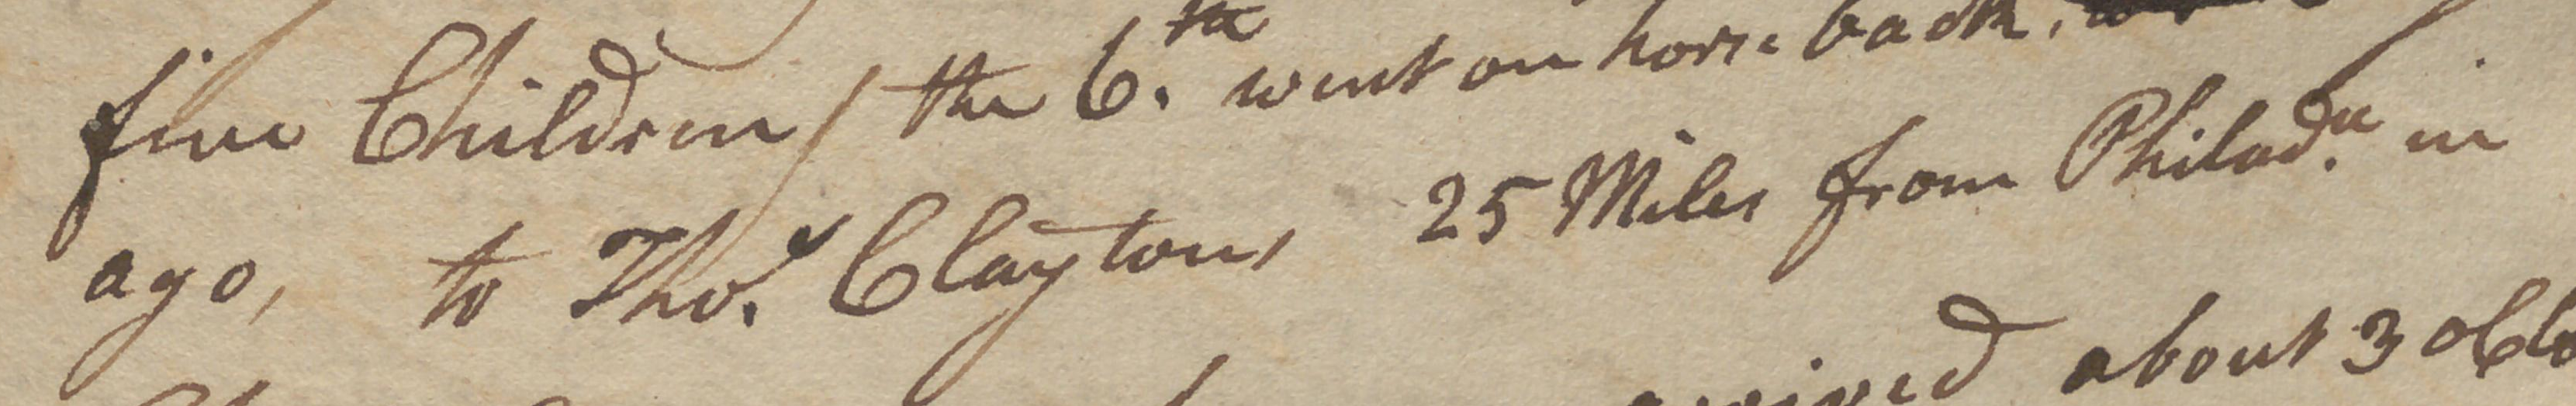ago, to Tho^s. Claytons 25 Miles from Philad^a. in
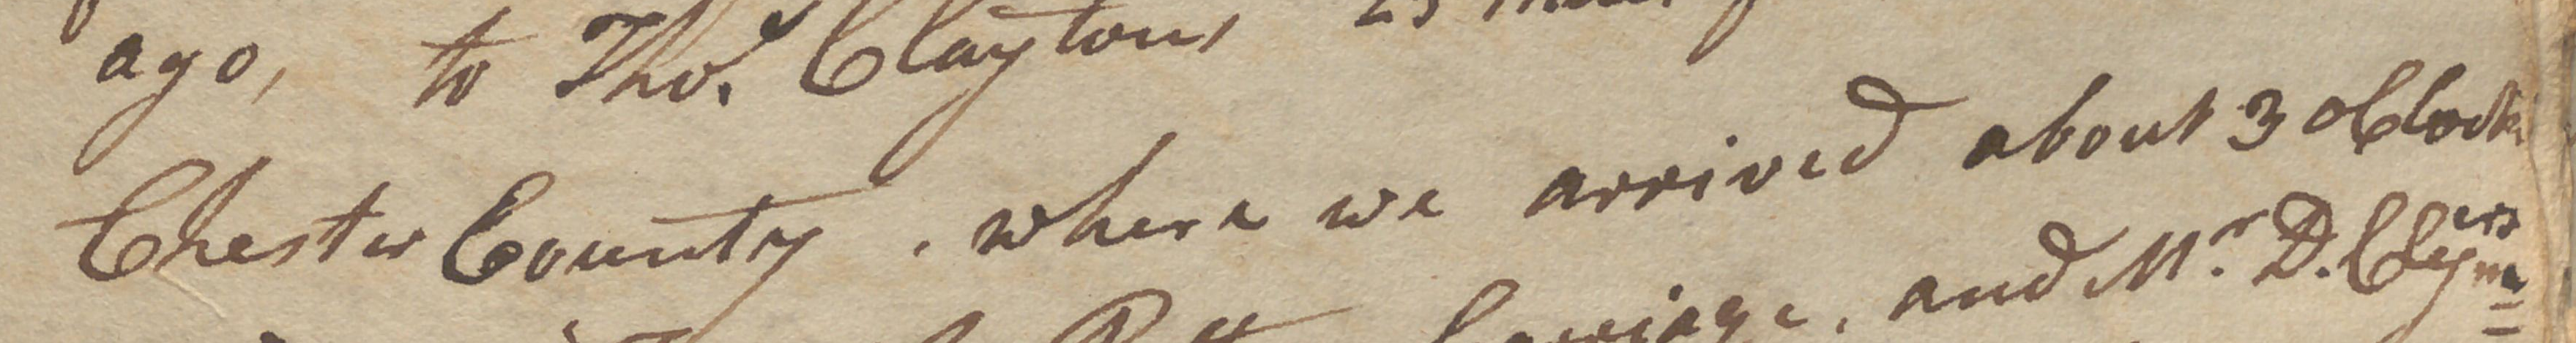Chester County, where we arrived about 3 oClock
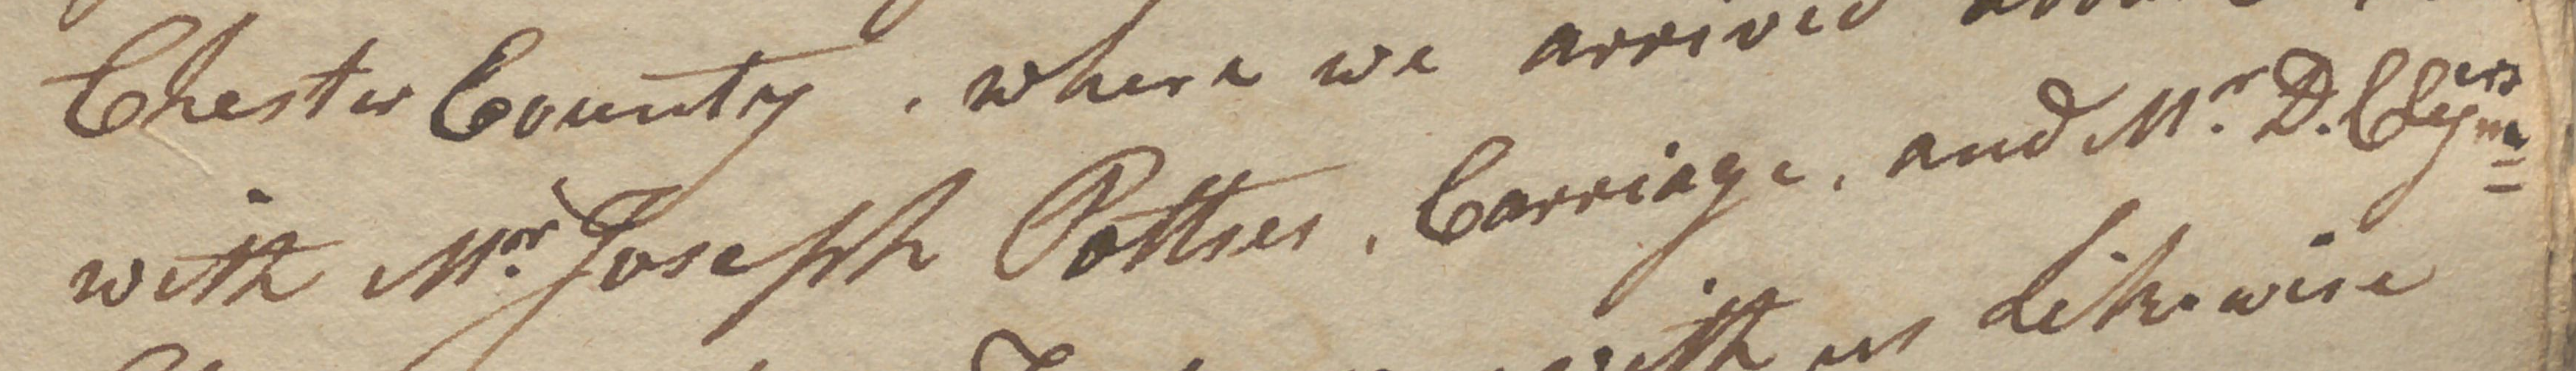with M^r. Joseph Pottses Carriage, and M^r. D. Cly^mers
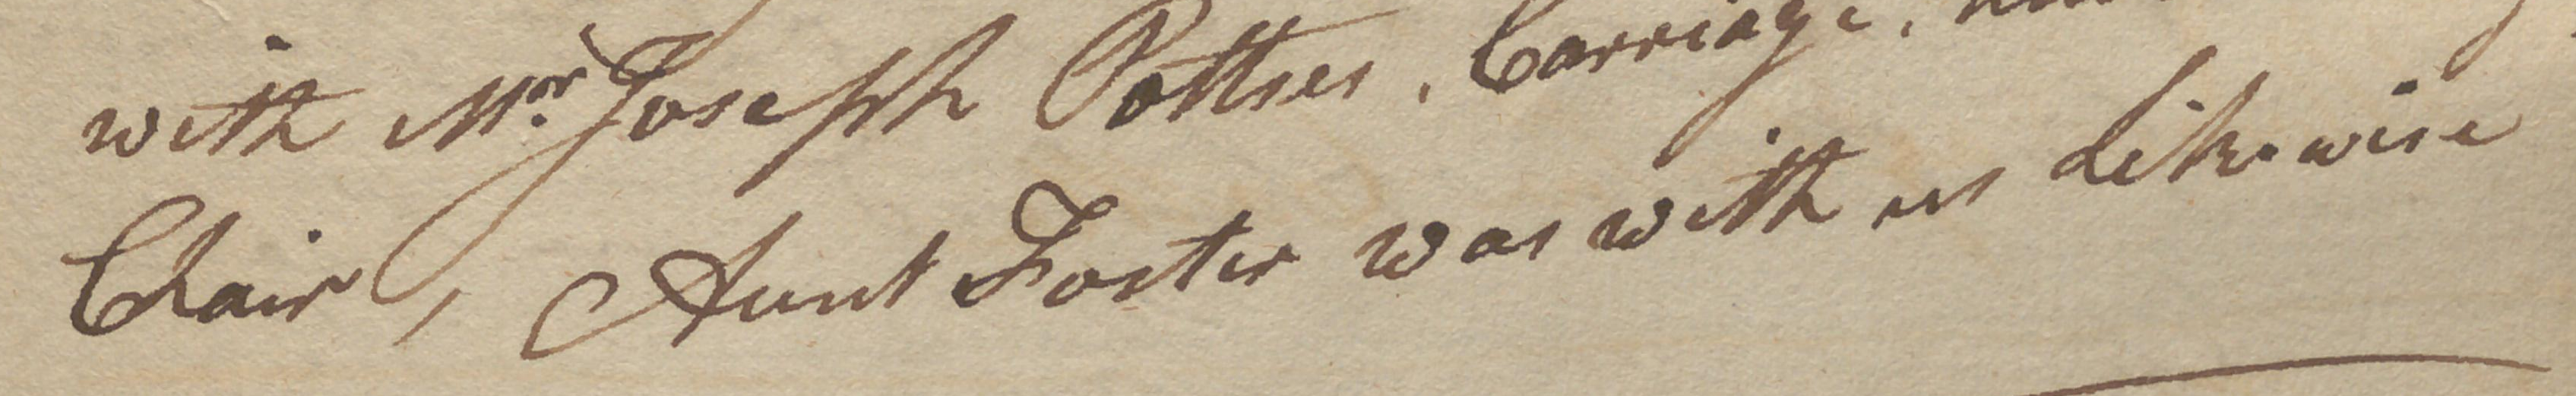Chair, Aunt Foster was with us Likewise
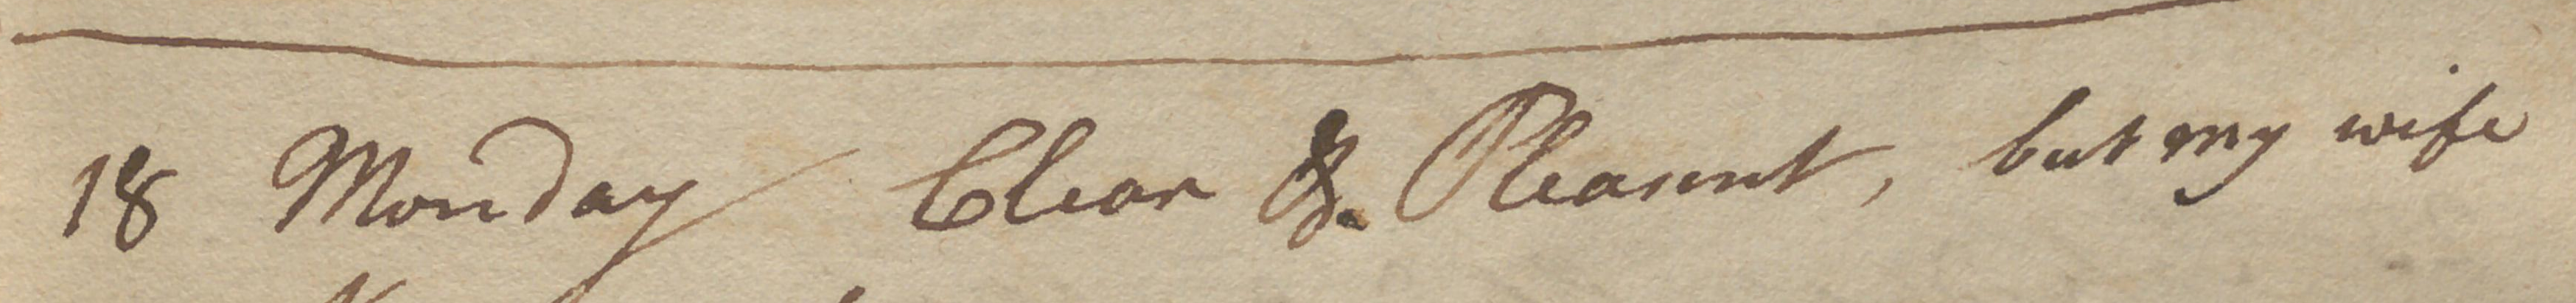18 Monday Clear &. Pleasent, but my wife
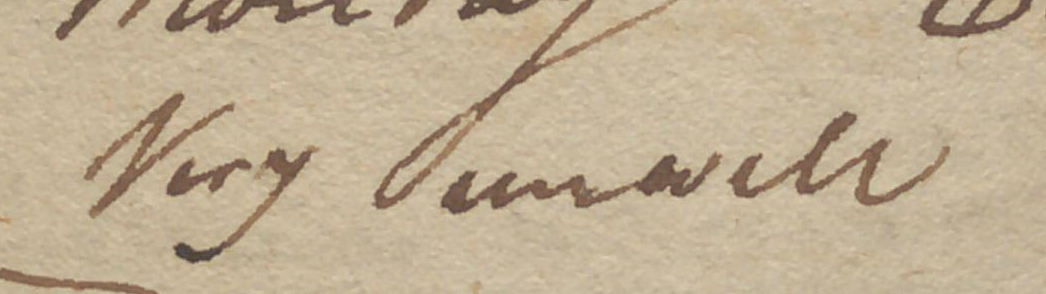Very unwell
